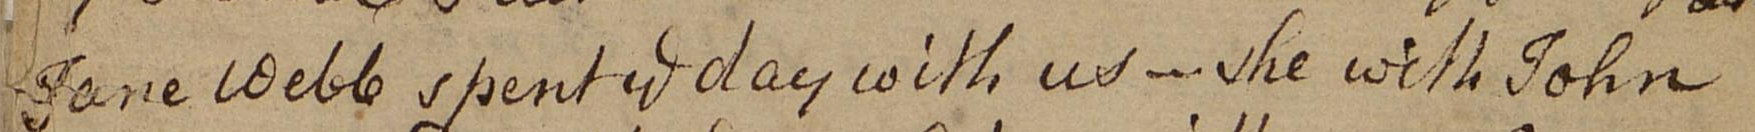Jane Webb spent y^e day with us- she with John
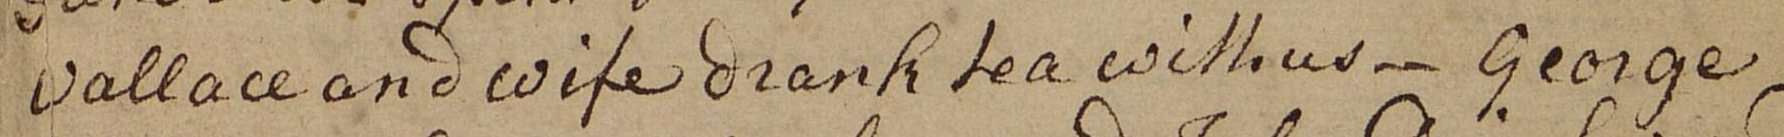Wallace and Wife drank tea with us- George
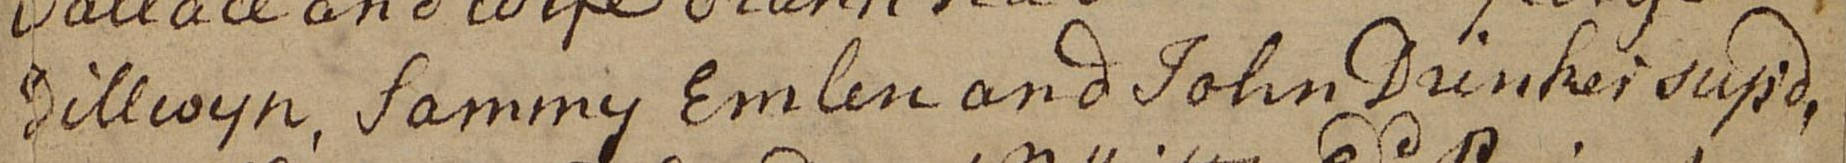Dillwyn, Sammy Emlen and John Drinker sup'd,
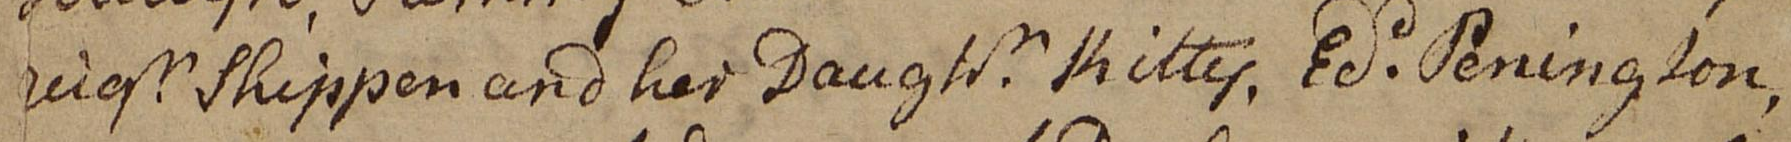[N]eigh^r. Shippen and her Daugh^r. Kitty, Ed^d. Penington,
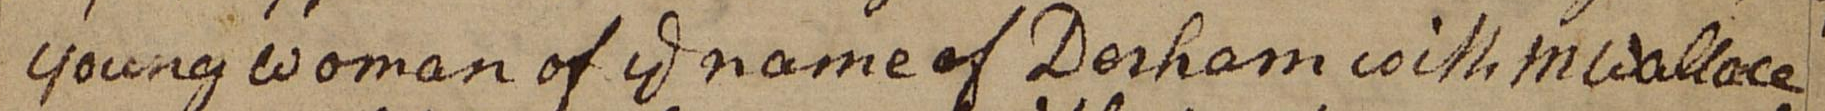young woman of y^e name of Derham with M Wallace,
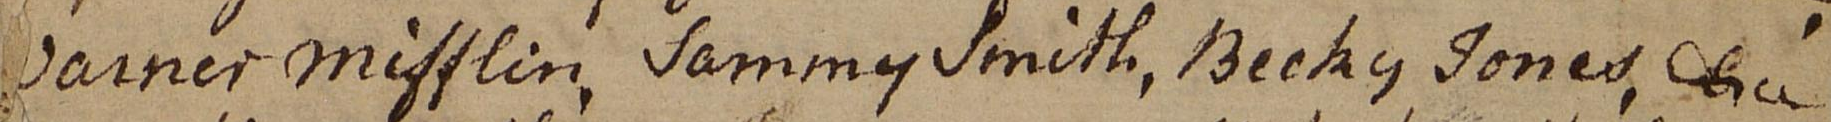[_]arner Mifflin, Sammy Smith, Becky Jones, &c
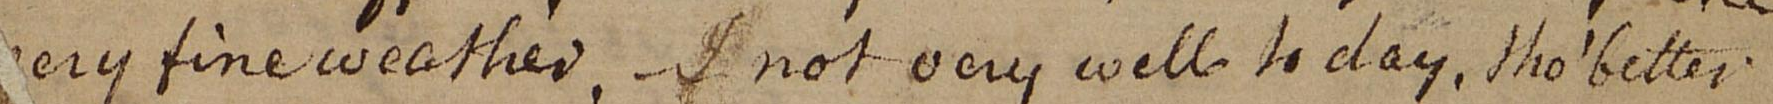[_]ery fine weather,- I not very well to day, tho' better
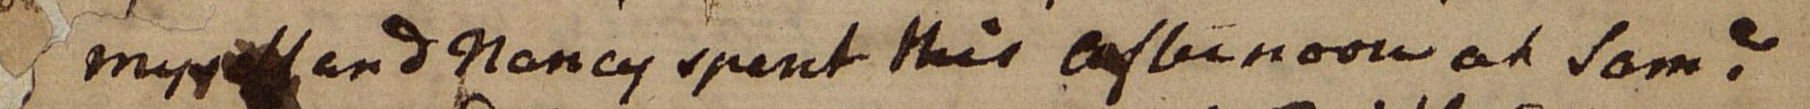mys[elf] and Nancy spent this afternoon at Sam^l.
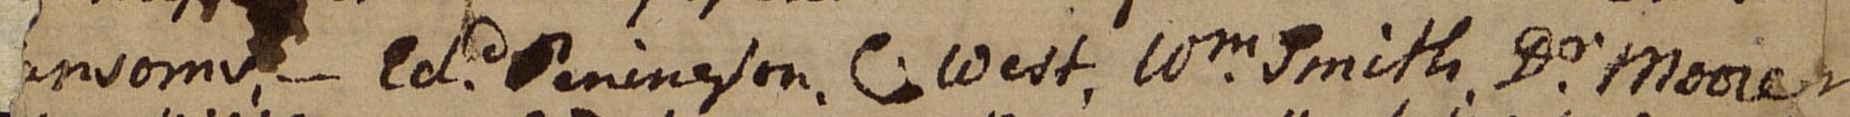ansoms,- Ed^d. Penington, C. West, W^m. Smith, D^r. Moore
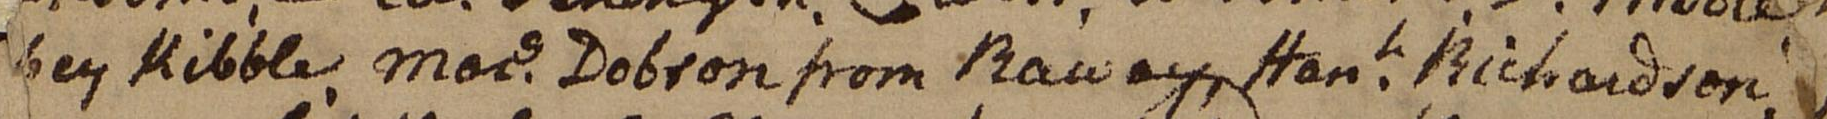bey Kibble, Mar^g. Dobson from Raway, Han^h. Richardson,
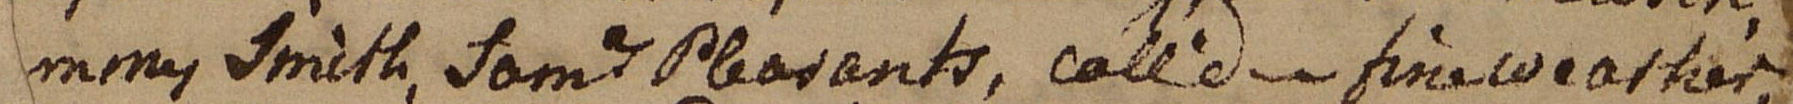mmy Smith, Sam^a. Pleasants, call'd-- fine weather,
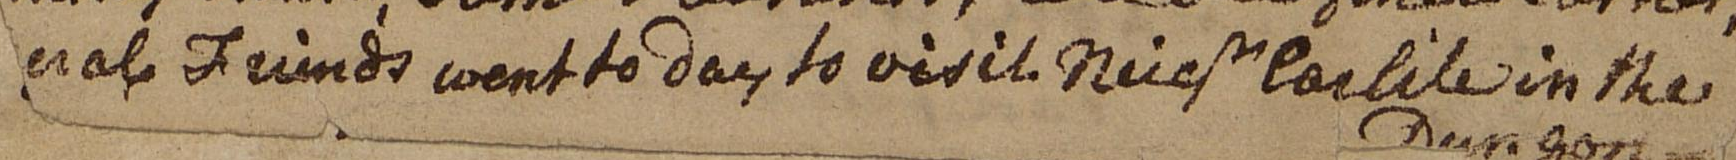eral Friends went to day to visit Neig^r Carlile in the
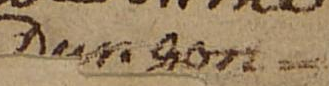[________]
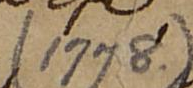1778
